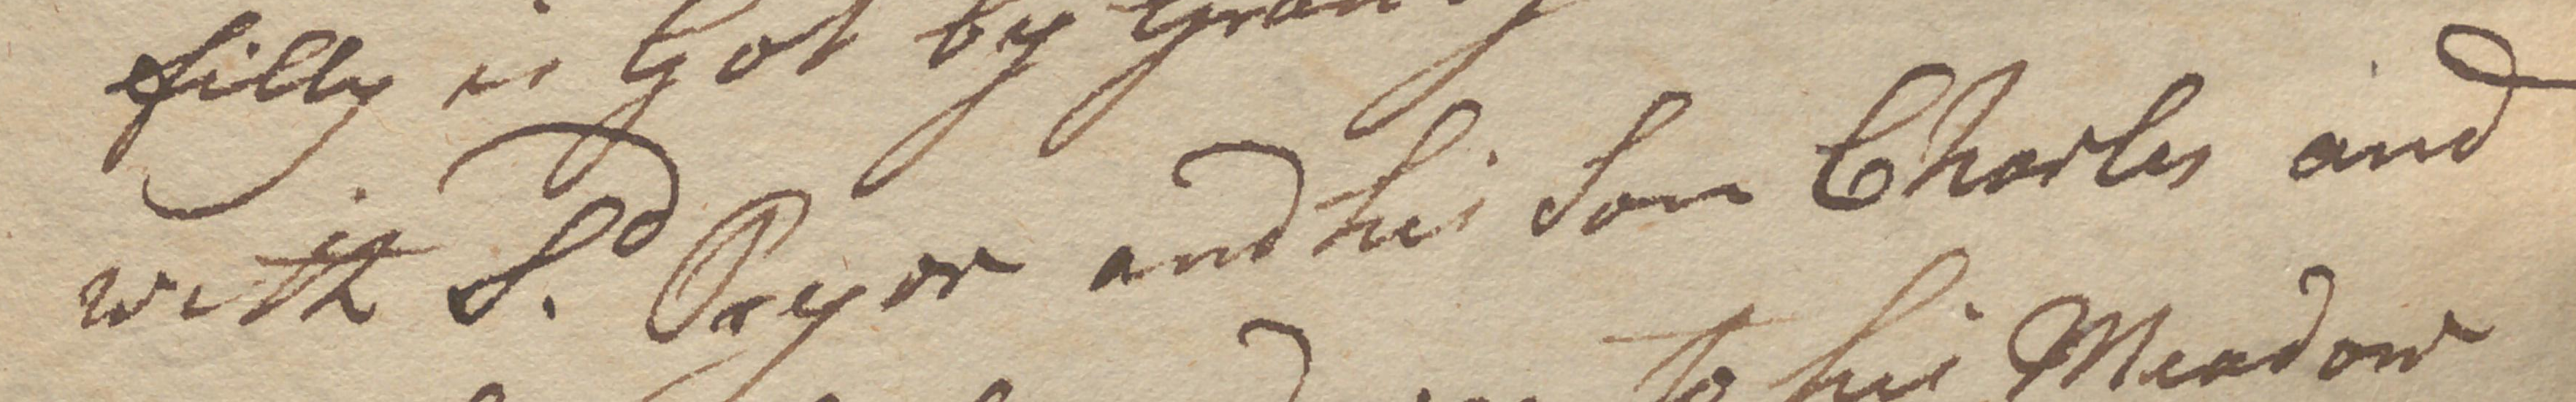with S^d. Pryor and his Son Charles and
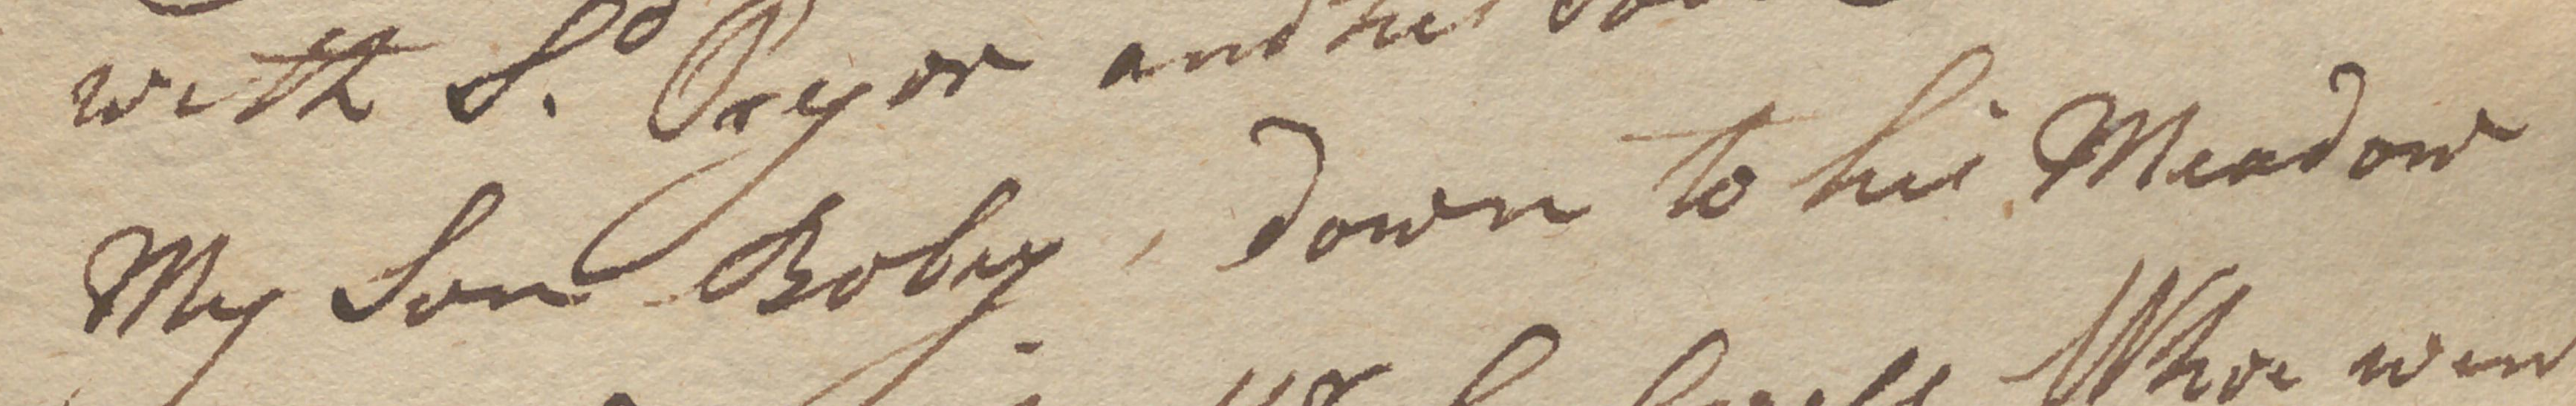My Son Bobey, down to his Meadow
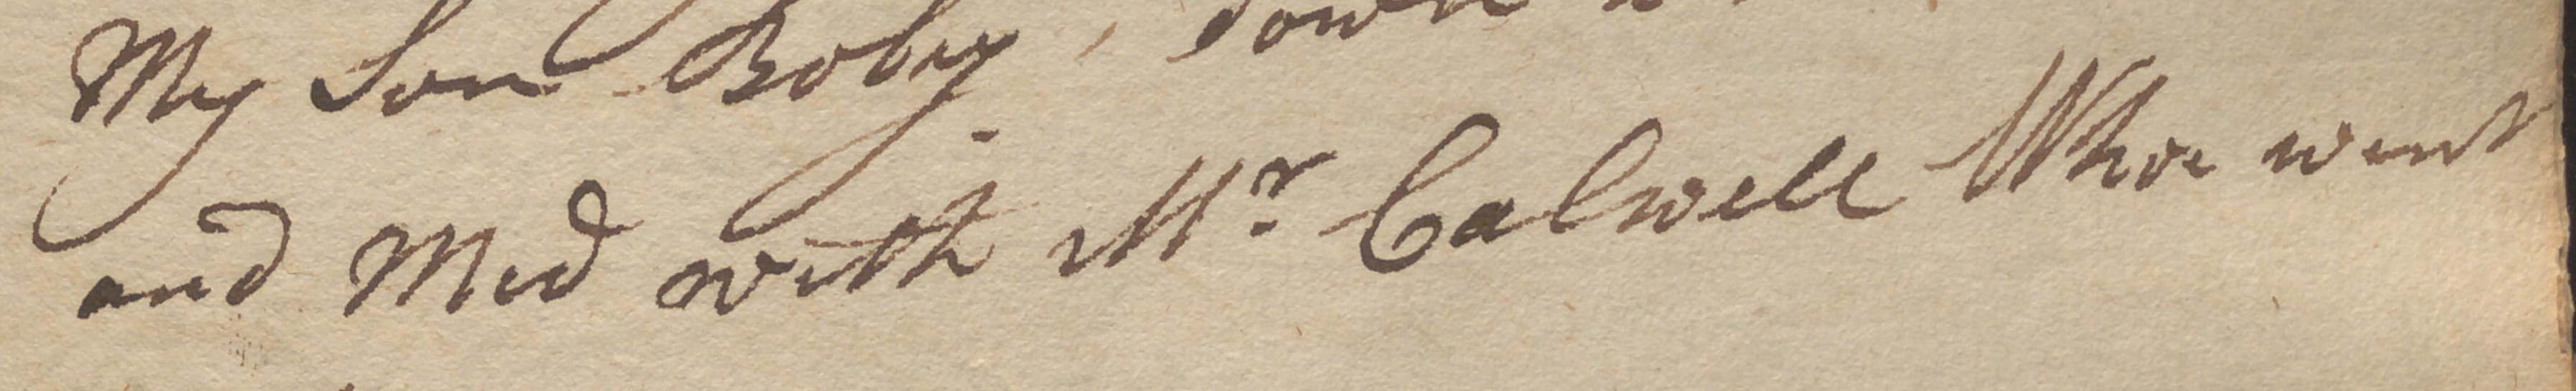and Med with M^r. Calwell Whoe went
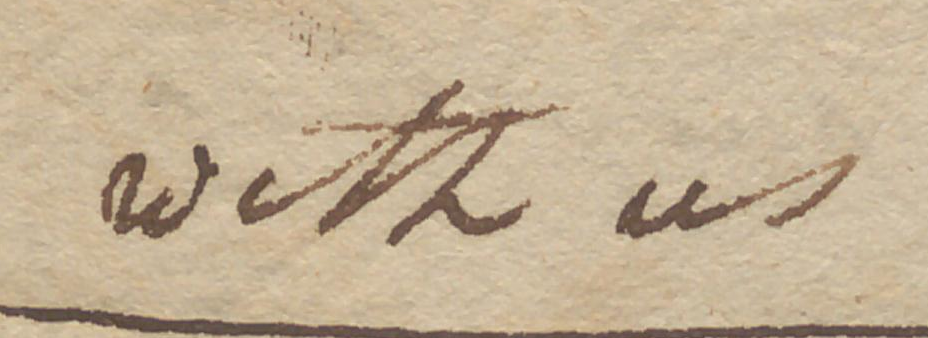with us
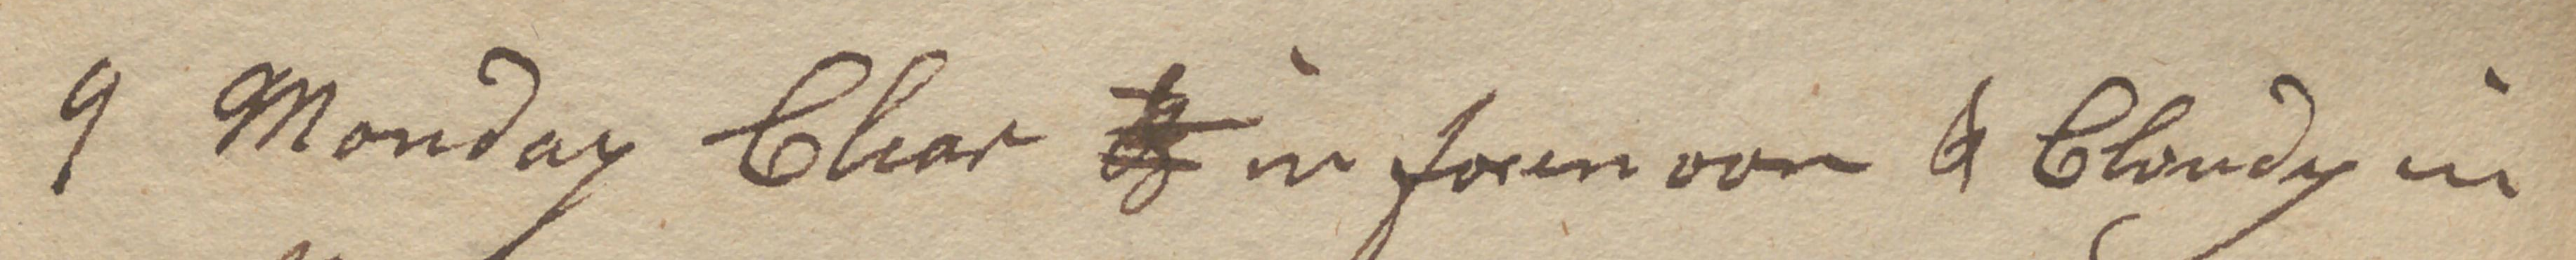9 Monday Clear [&] in forenoon & Cloudy in
